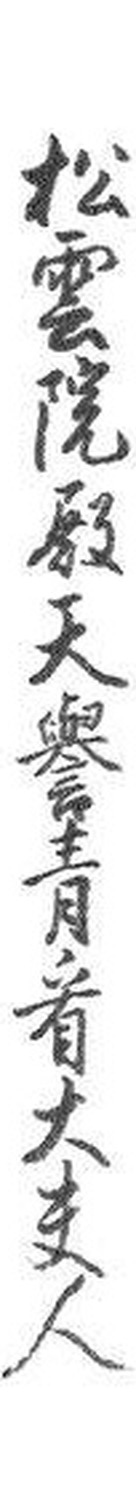松雲院殿天誉青看大夫人
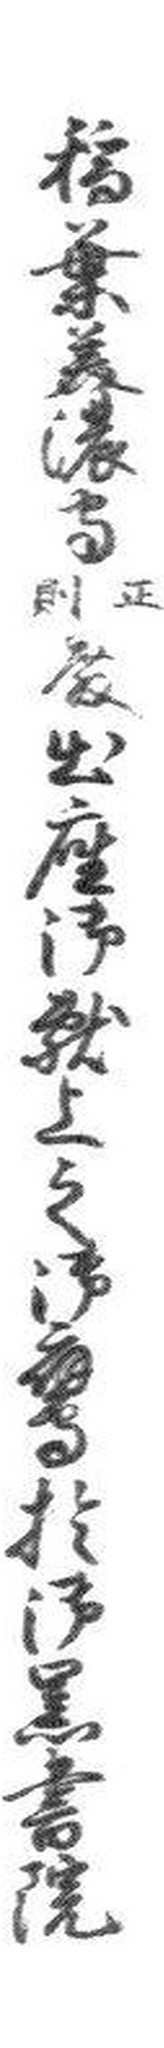稲葉美濃守正則殿出座御献上之御鷹於黒書院
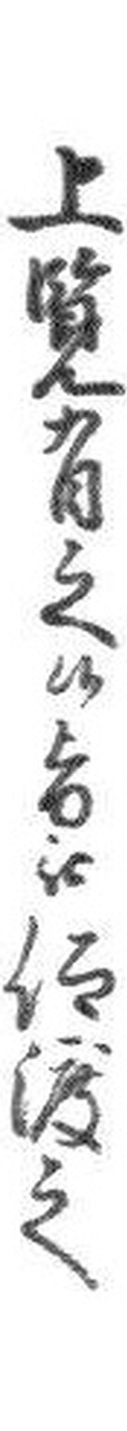上覧有之候旨被仰渡之
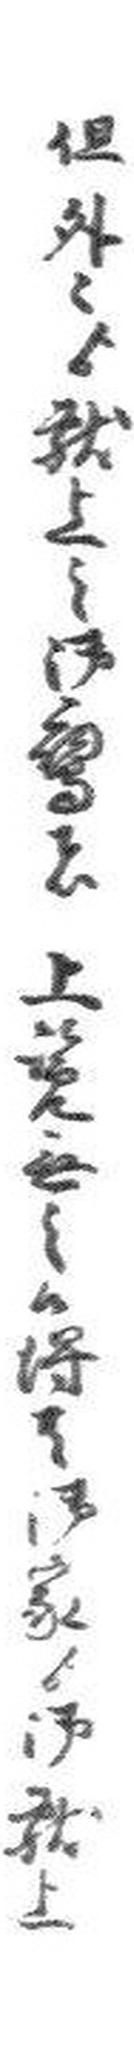但外々ゟ献上之御鷹者上覧無之候得共御家ゟ御献上
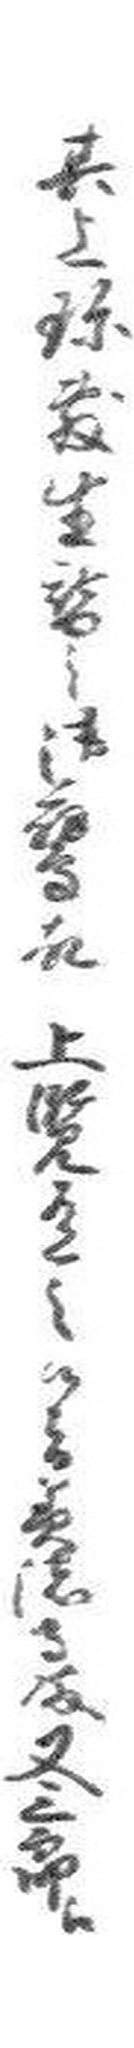其上珍敷生替之御鷹故上覧有之旨美濃守殿又三郎江
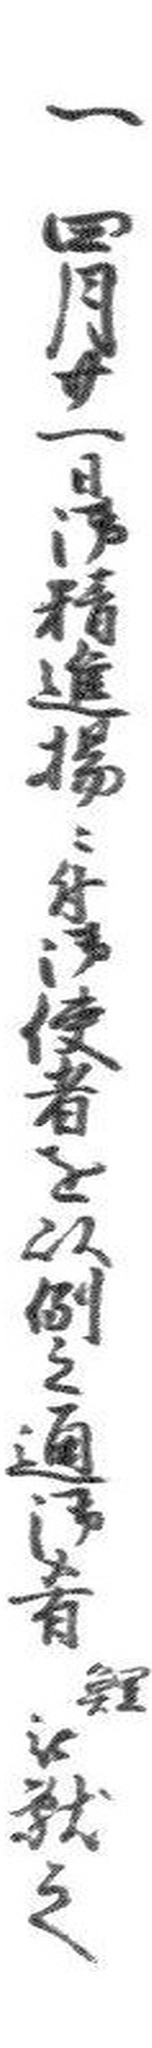一四月廿一日御精進揚ニ付御使者を以例之通御肴鯉被献之

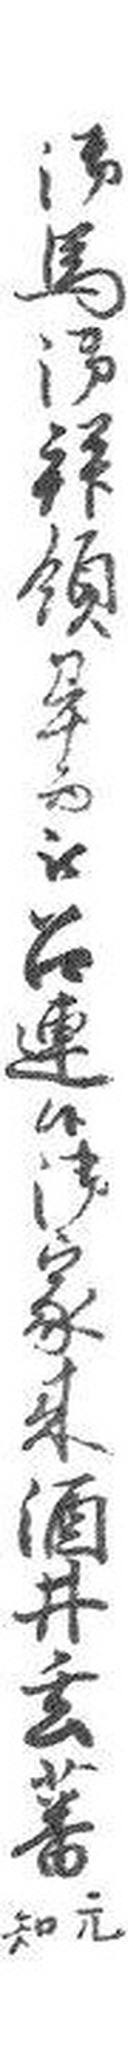御馬御拝領畢而被召連候御家来酒井玄蕃元知
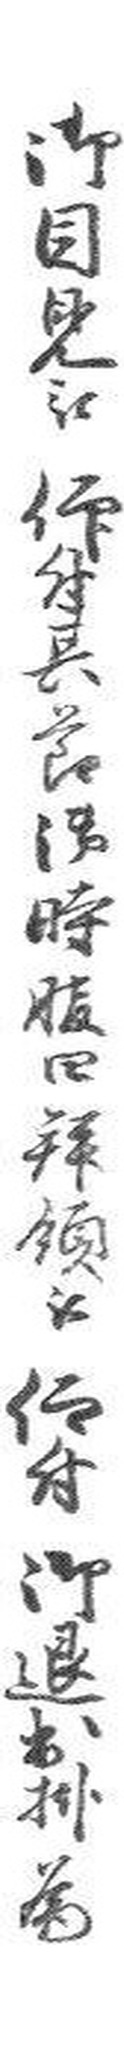御目見被仰付其節御時服四拝領被仰付御退去掛為
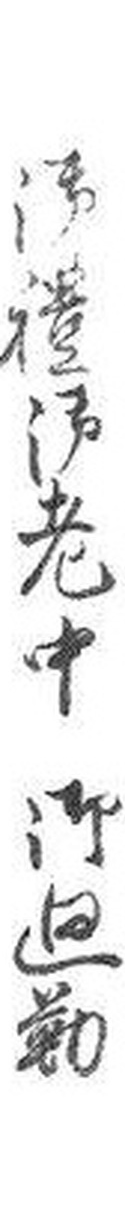御礼御老中御回勤
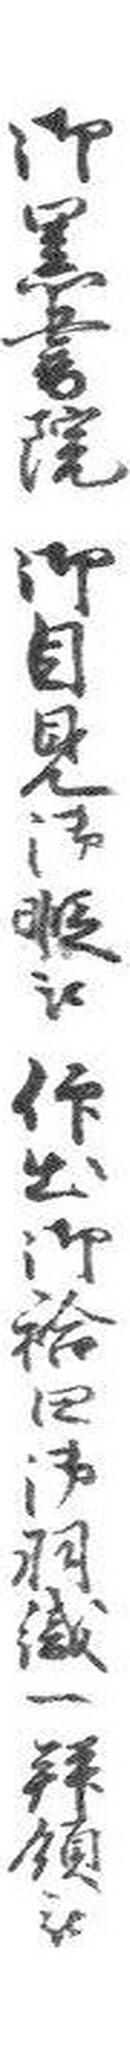御黒書院御目見御暇被仰出御袷四御羽織一拝領被
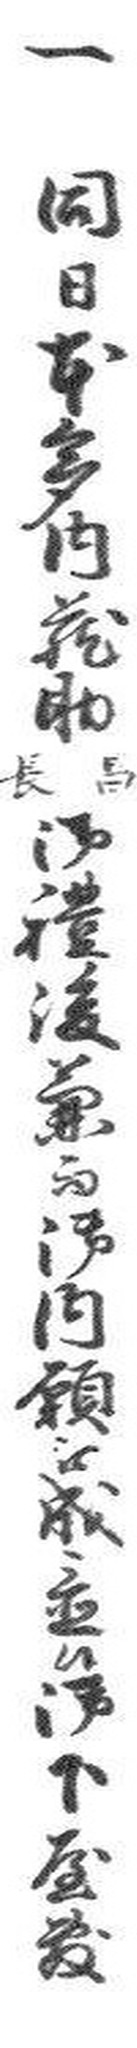一同日本多内蔵助昌長御礼後兼而御内願被成置候御下屋敷
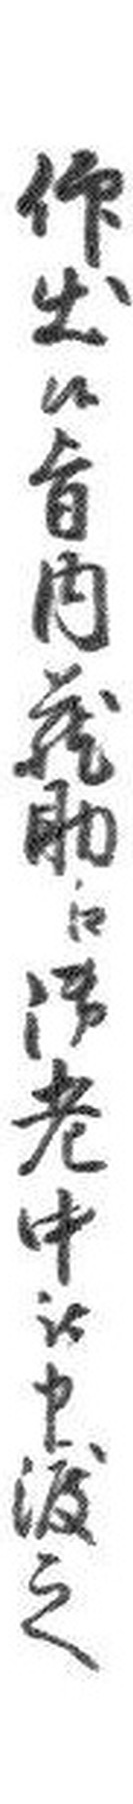仰出候旨内蔵助江御老中被申渡之
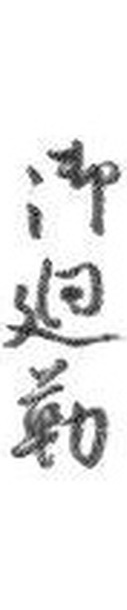御回勤
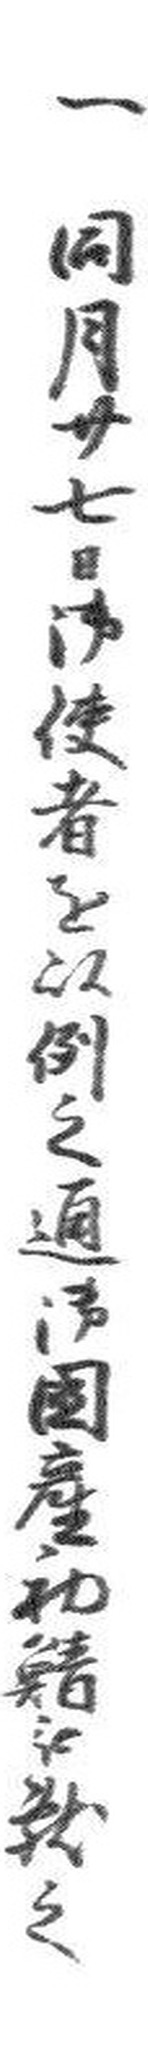一同月廿七日御使者を以例之通御国産初鯖被有之
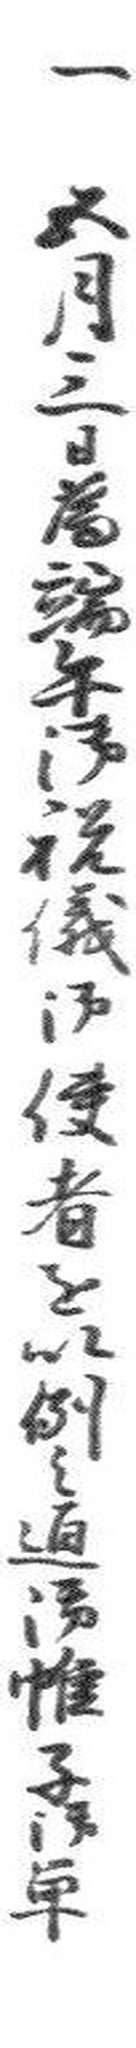一五月三日為端午御祝儀御使者を以例之通御帷子御単
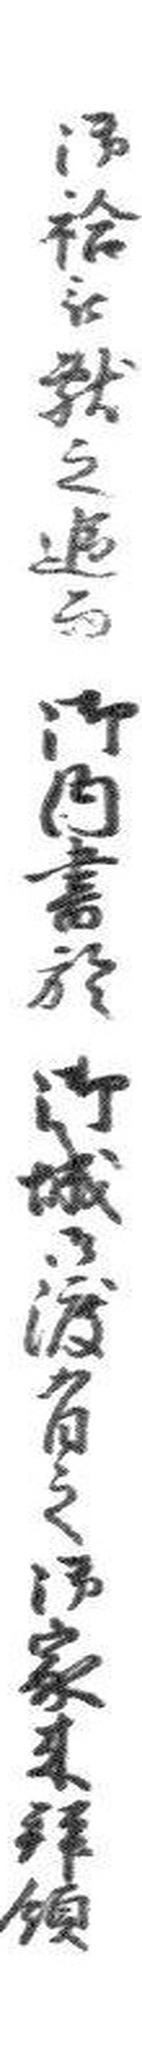御袷被献之追而御内書於御城御渡有之御家来拝領
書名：家譜 七 光通公 従寛文四年到同九年
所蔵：福井県文書館 Fukui Prefectural Archives
